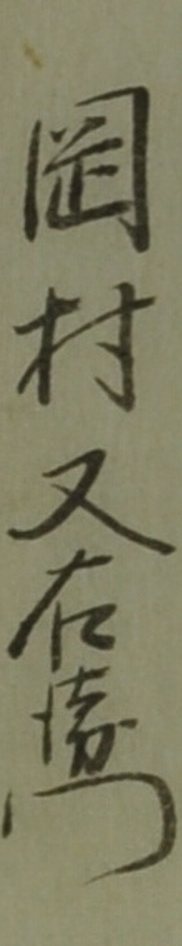岡村又右衛門
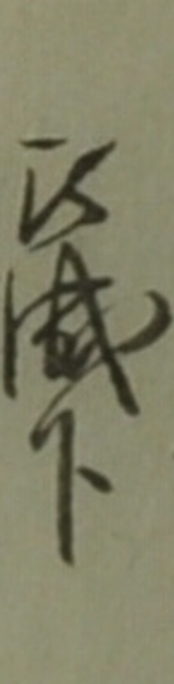被成下
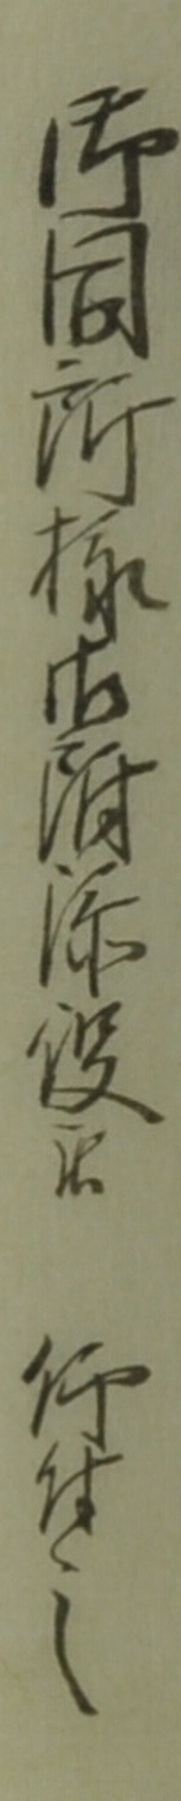御同所様御附添役被仰付之
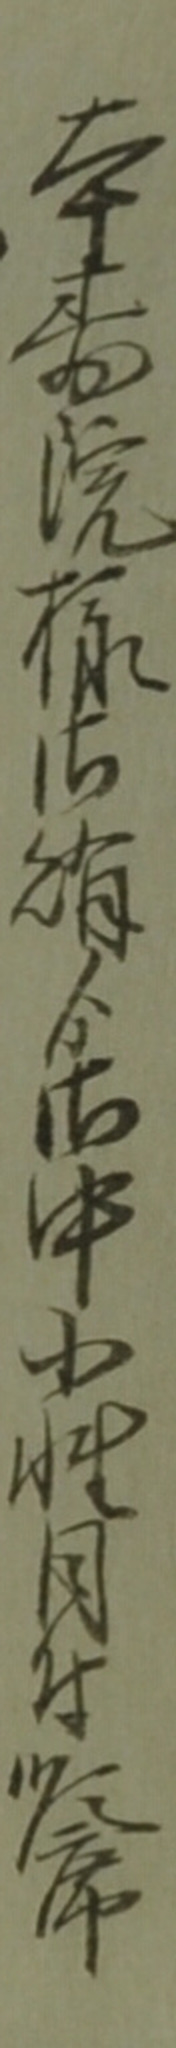本寿院様御賄ゟ御中小性目付順席

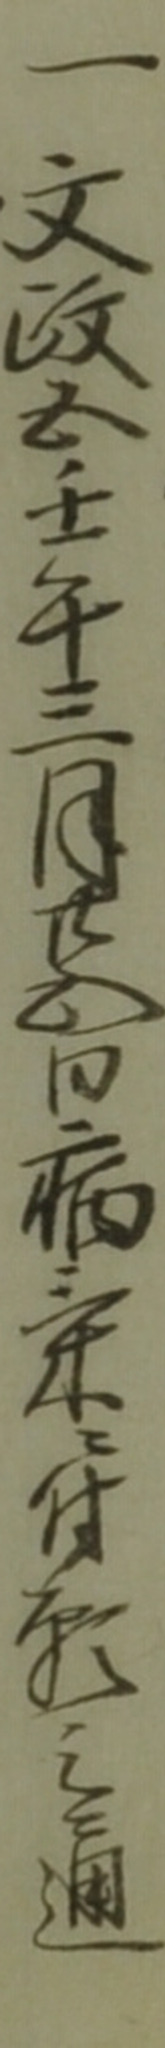一文政五壬午三月廿五日病気ニ付願之通
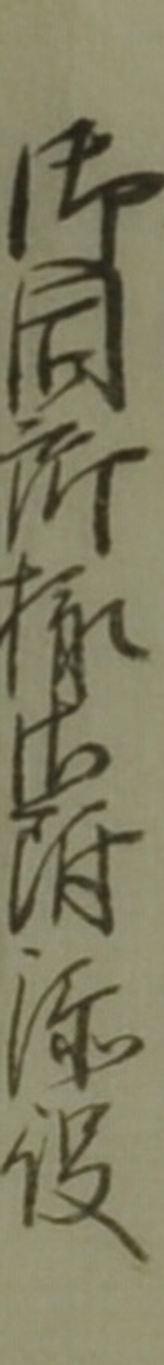御同所様御附添役
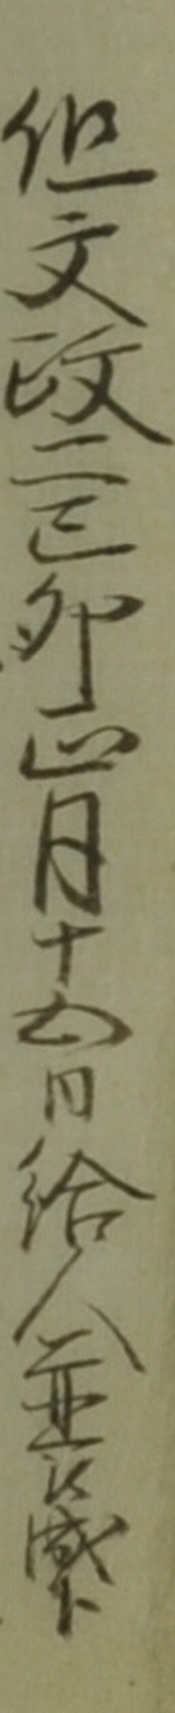但文政二己卯正月十五日給人並被成下
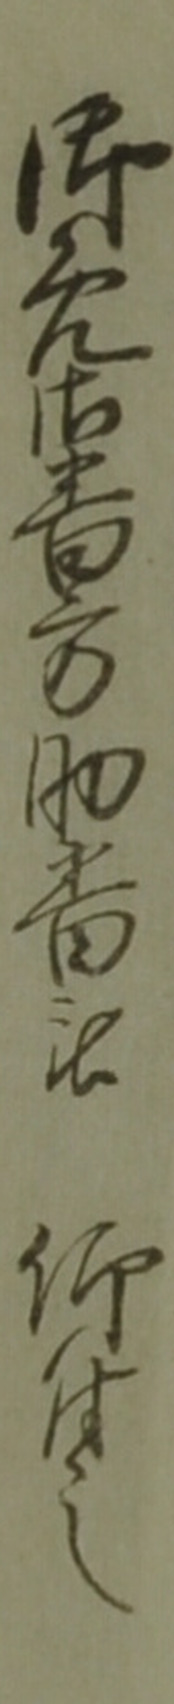御免御番方助番被仰付之
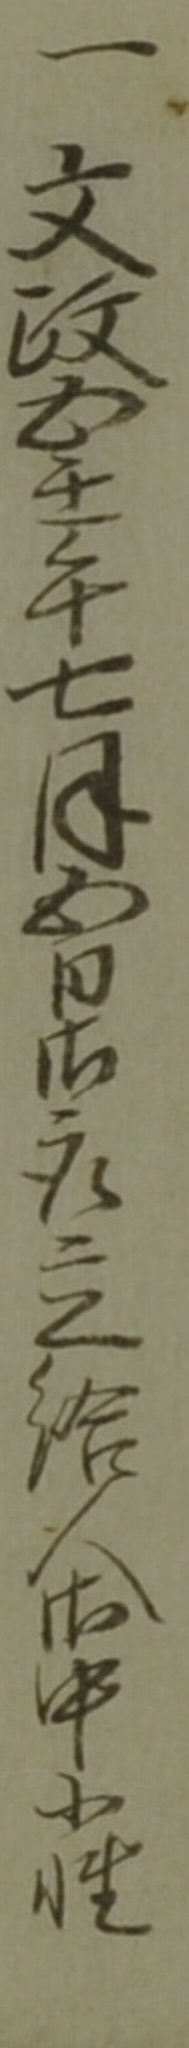一文政五壬午七月五日御取立給人御中小性
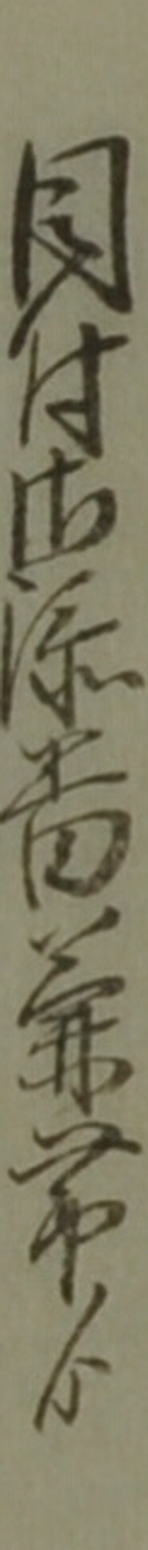目付御添番兼帯ゟ
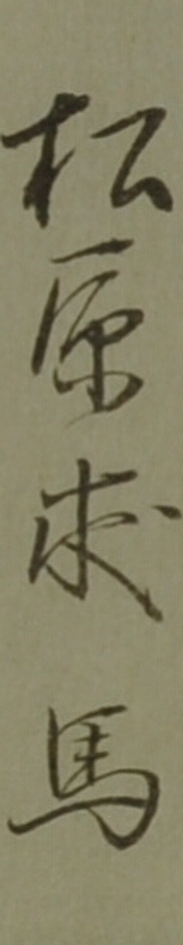松原求馬
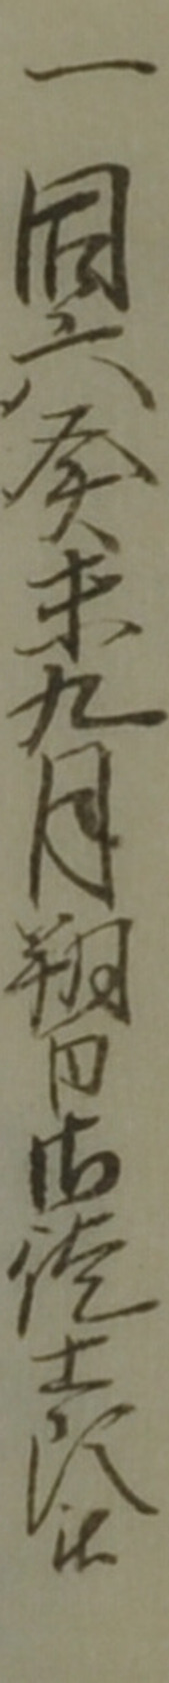一同六癸未九月朔日御徒士頭被
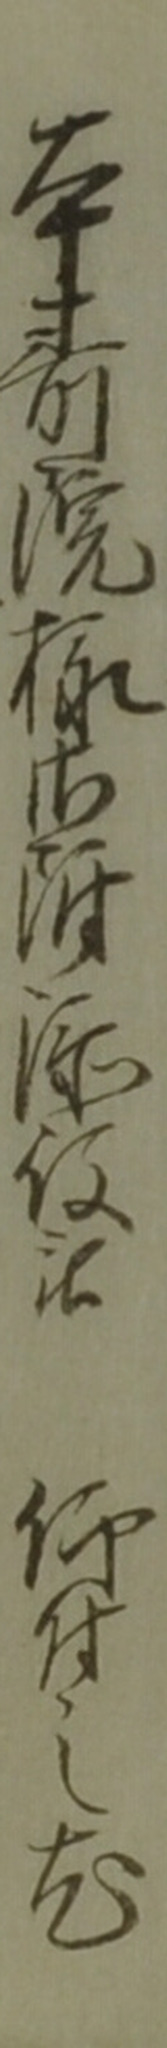本寿院様御附添役被仰付之尤
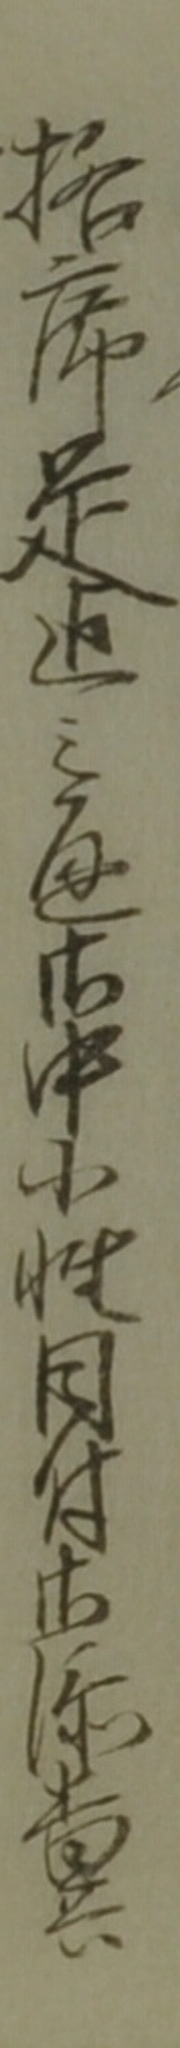格席是迄之通御中小性目付御添番共
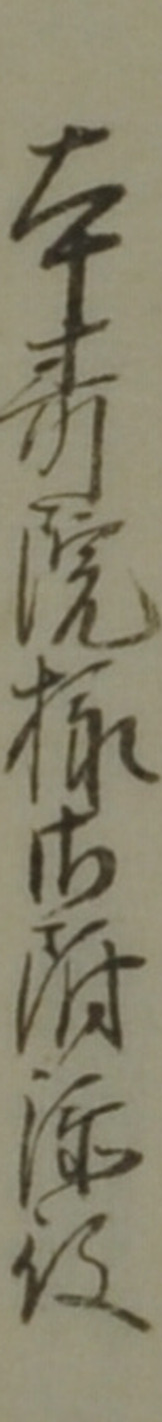本寿院様御附添役
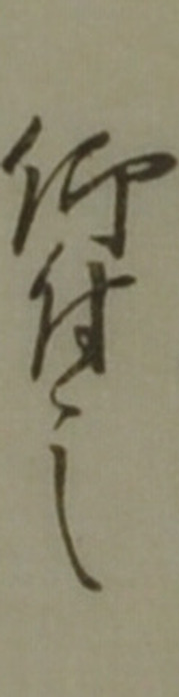仰付之
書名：諸御役代々録（六）
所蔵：伊那市立高遠町図書館・合同会社AMANE
